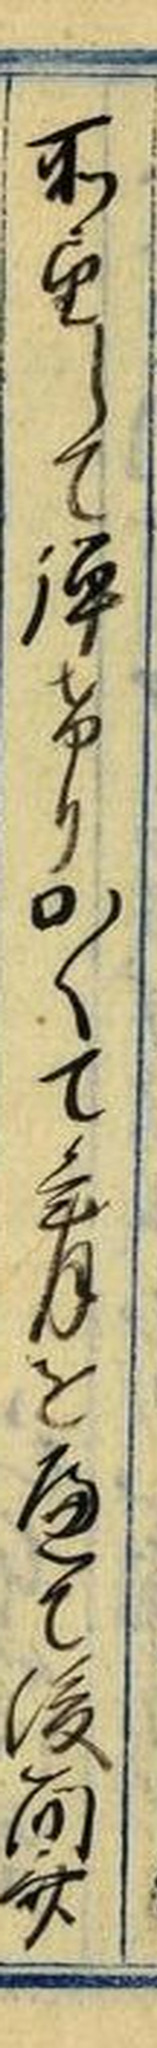所望して弾けりかくて年月をへて後簡齋
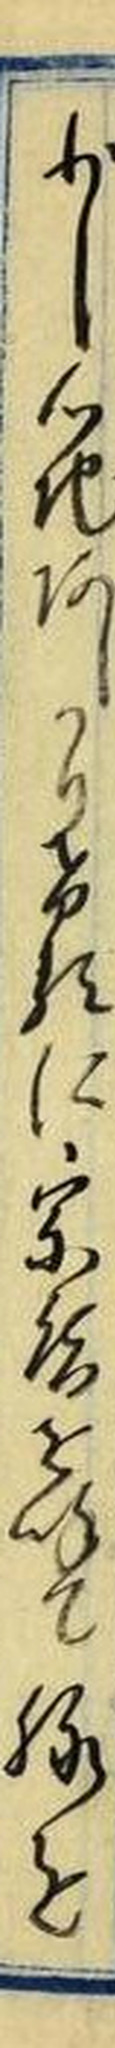少し心地あしかりけるに宗庵を呼て縁を
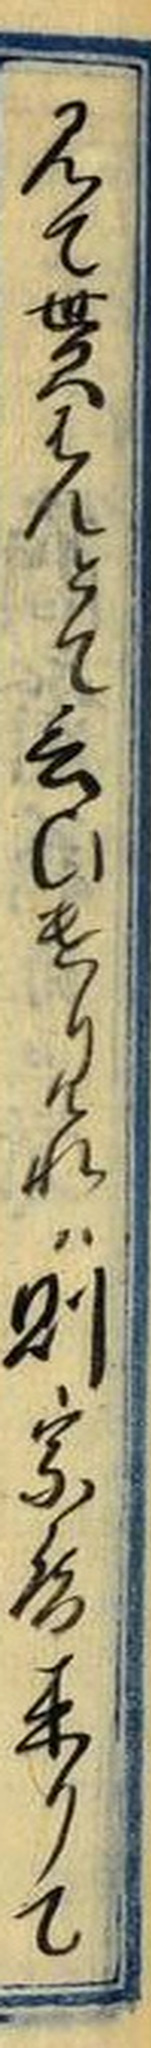見て貰はんとて言い遣りけれは則宗庵来りて
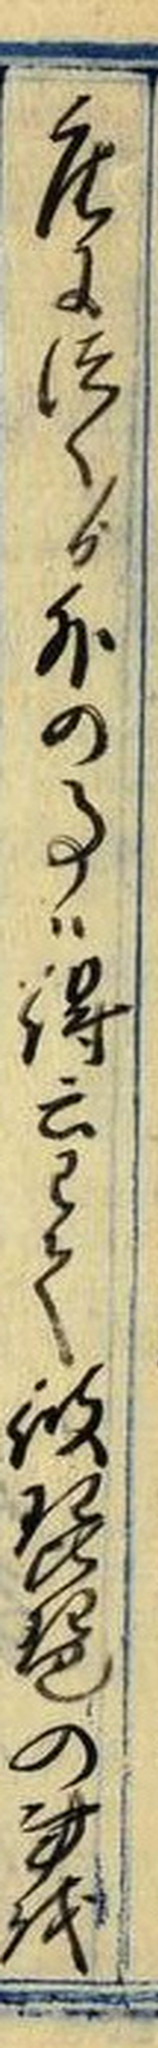座につくゟ外の事は得云わて彼琵琶の事を
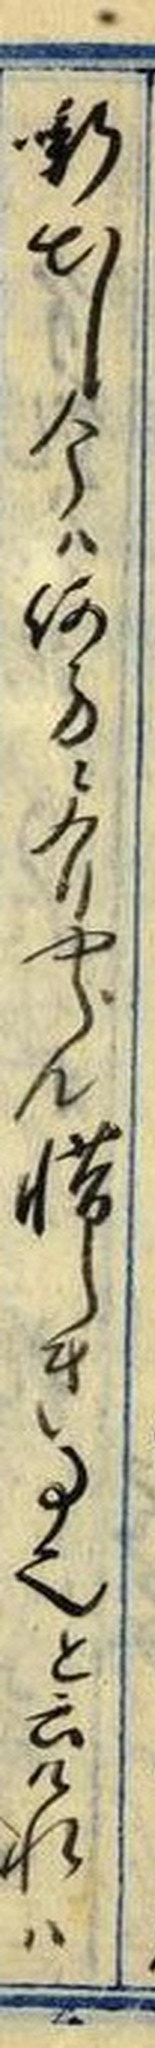噺出し今は何方に有やらん惜しき事也と云けれは
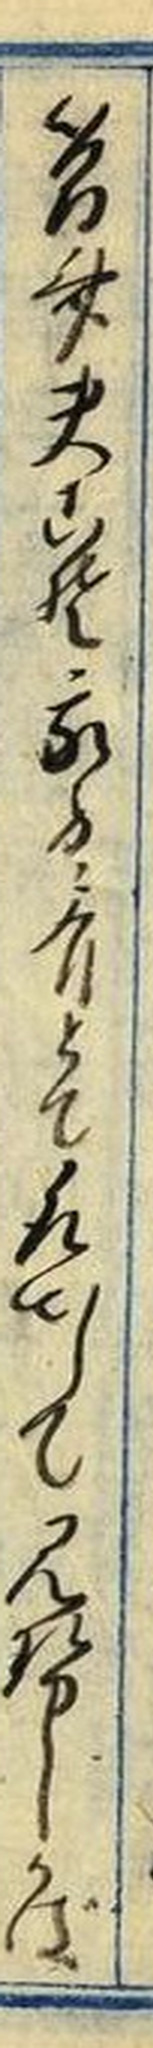簡齋夫こそ我方に有とて取出して見せしかば
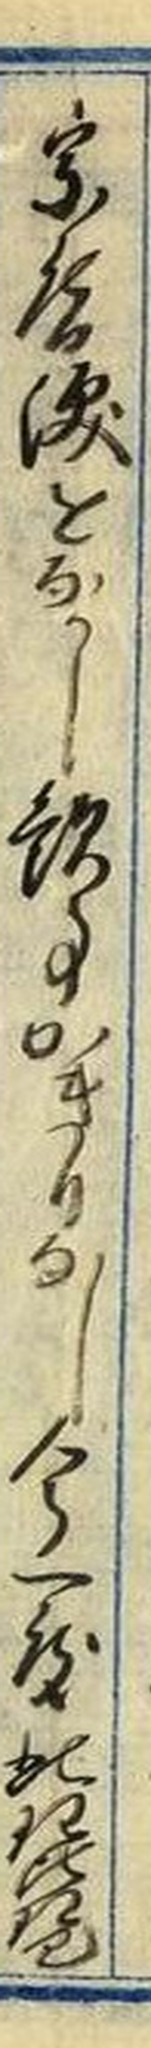宗庵涙をなかし歓事かきりなし今一度此琵琶
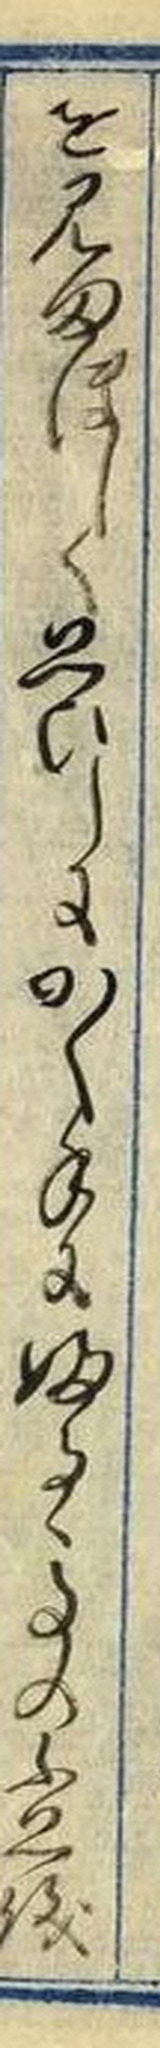を見まほしく思ひしにかく手にふるゝ事の不思議
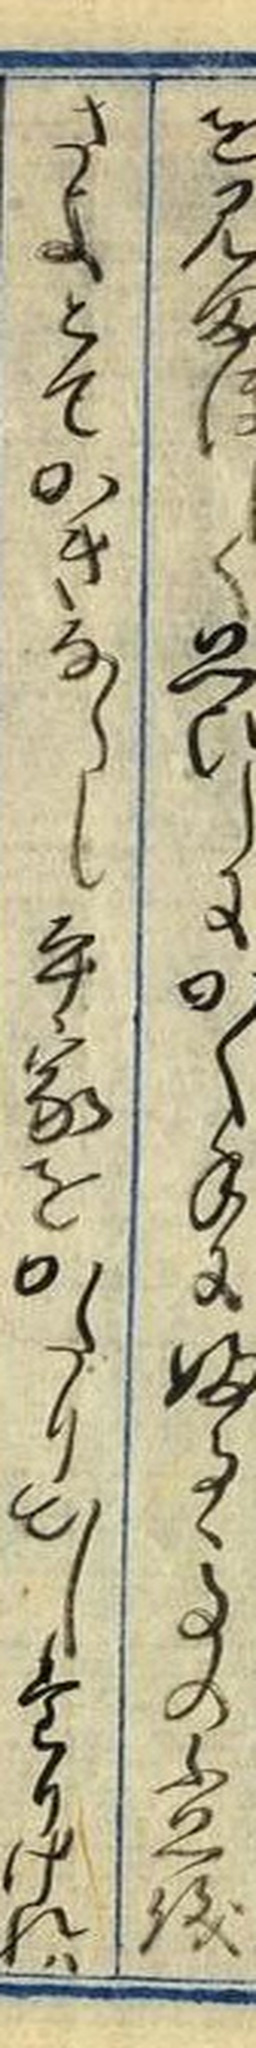さよとてかきならし平家をかたり出したりけれは
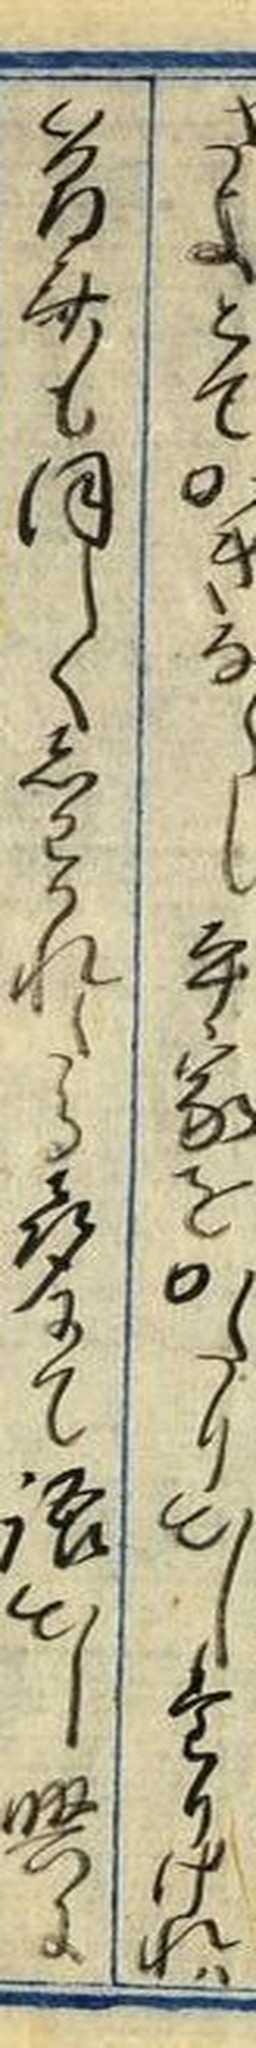簡斎も同しくしわかれたる声にて語出し興に
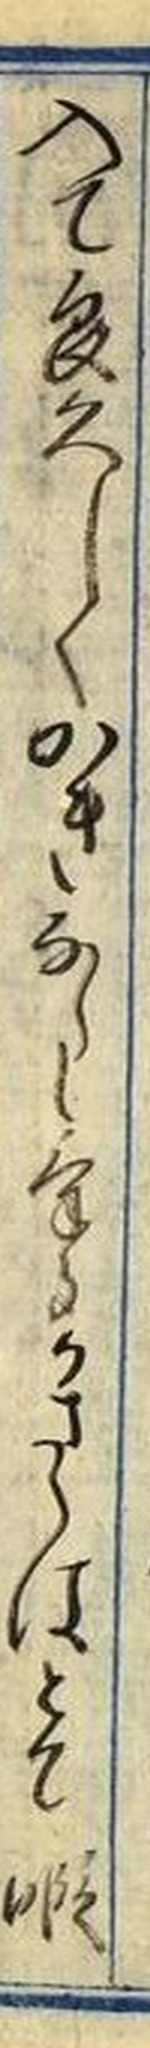入て良久しくかきならしけるかさらはとて暇
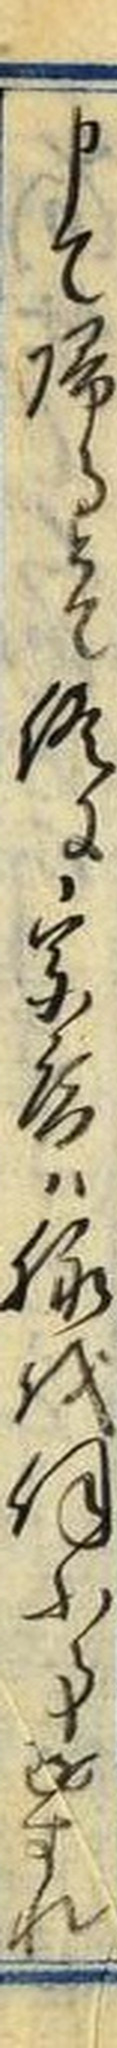申て帰るとて終に宗庵は縁を伺ふ事をわすれ

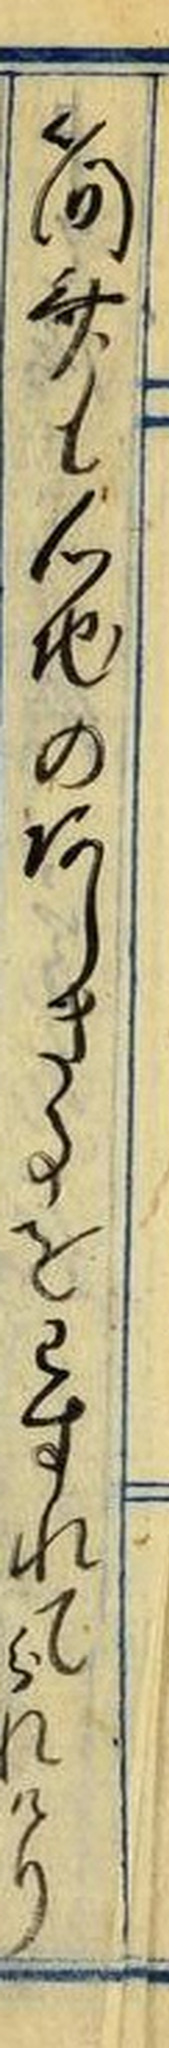簡斎も心地のあしき事をわすれて分れけり
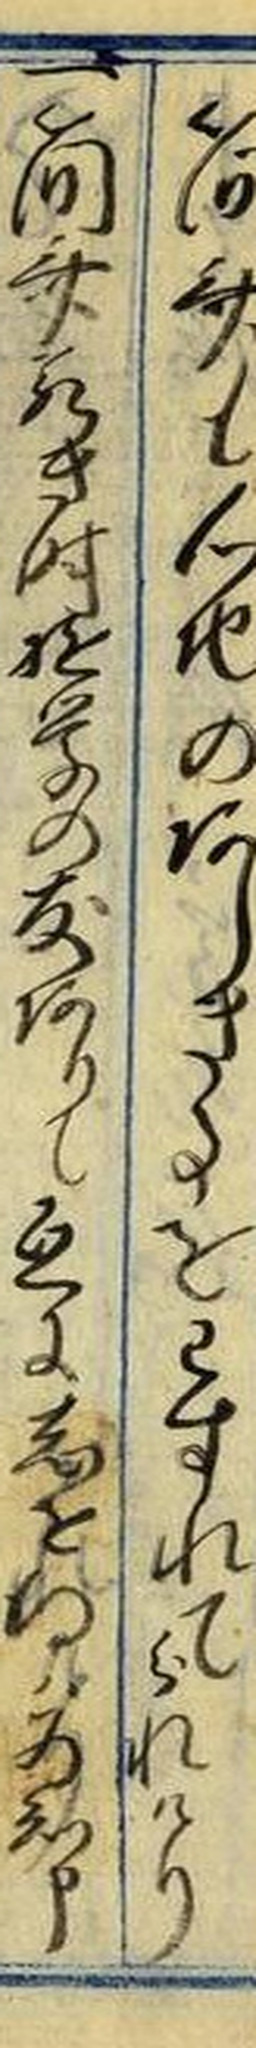一簡斎若き時遊学の友ありて互に志を得は為知申
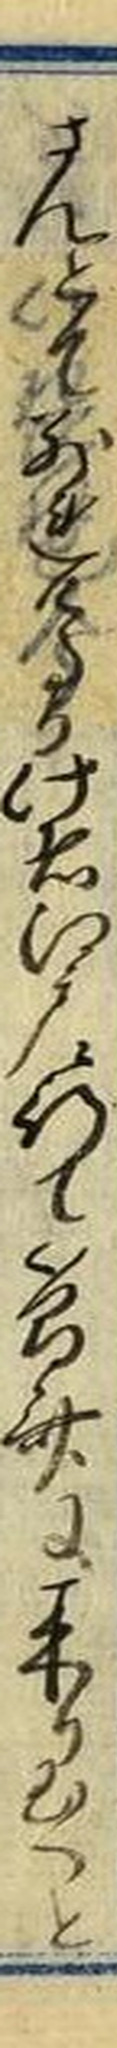さんとて別れけるか此者江戸に行て簡斎に来り玉へと
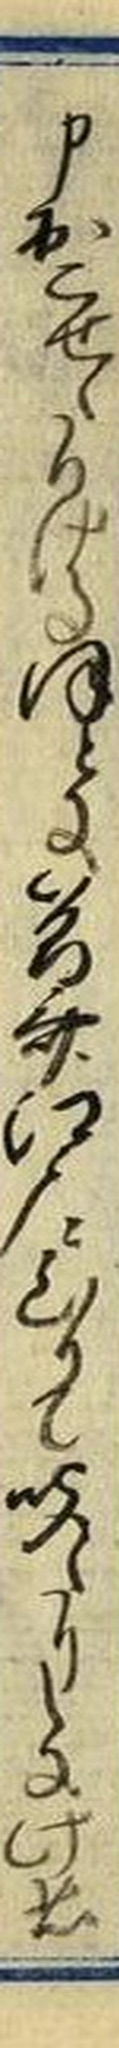申おこせたりけるほとに簡斎江戸に至りて聞たりしに此者
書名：温古集 四巻
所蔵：福井県文書館 Fukui Prefectural Archives
